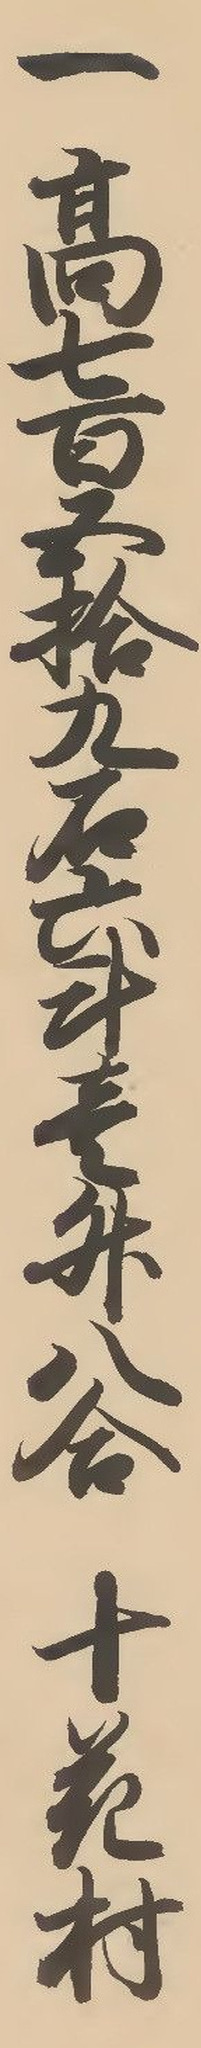一高七百五拾九石六斗壱升八合十花村
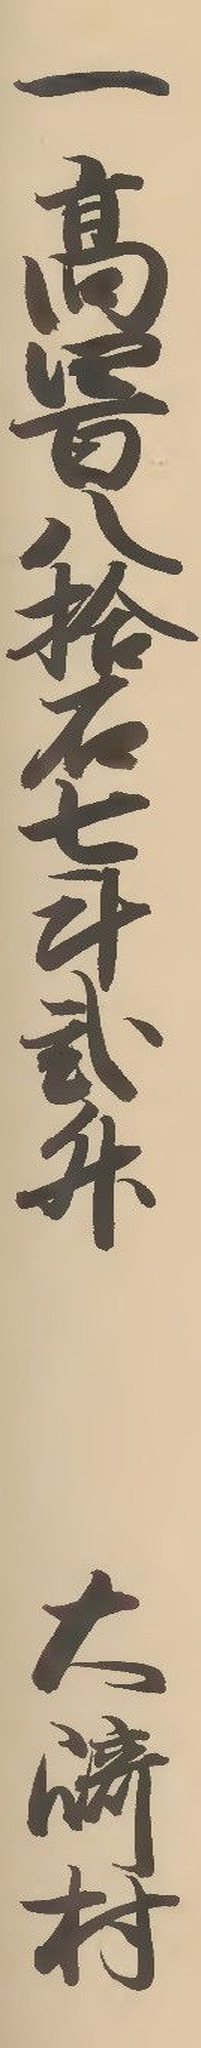一高四百八拾石七斗弐升大崎村
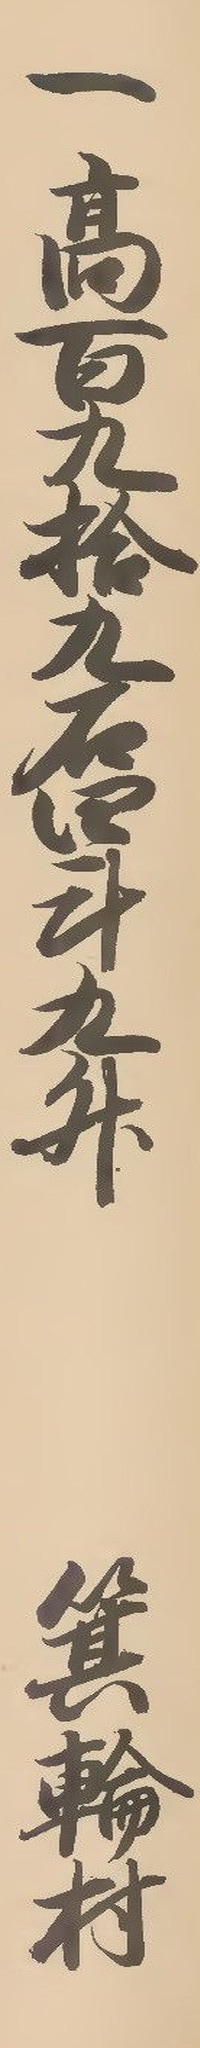一高百九拾九石四斗九升箕輪村
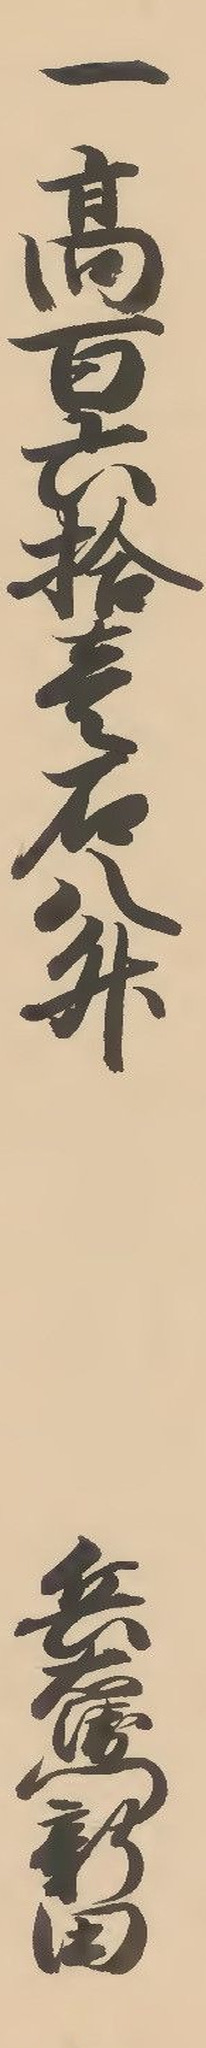一高百六拾壱石八升兵右衛門新田
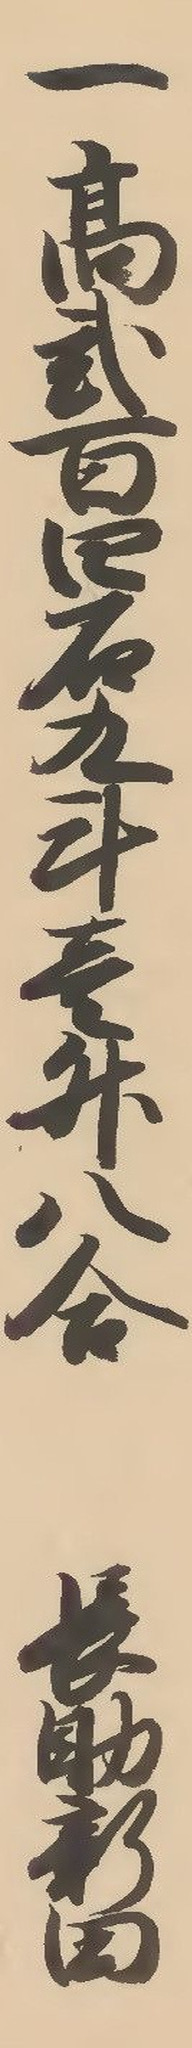一高弐百四石九斗壱升八合長助新田
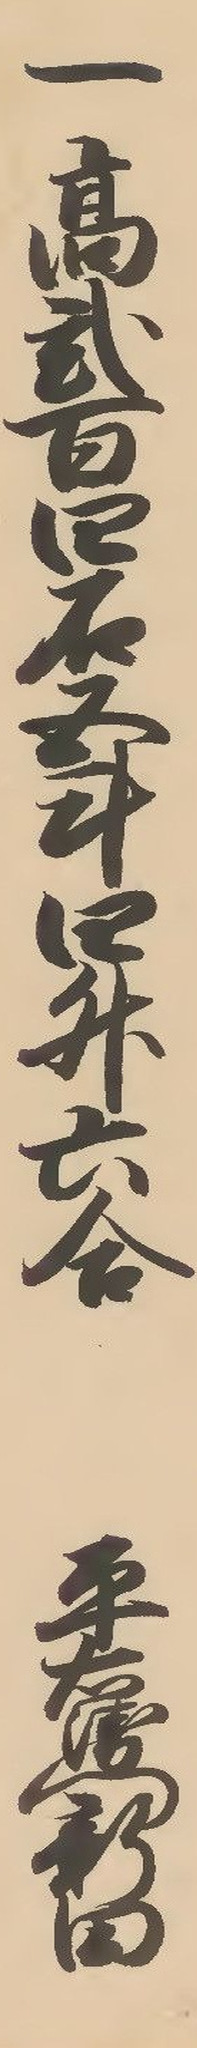一高弐百四石五斗四升六合平右衛門新田

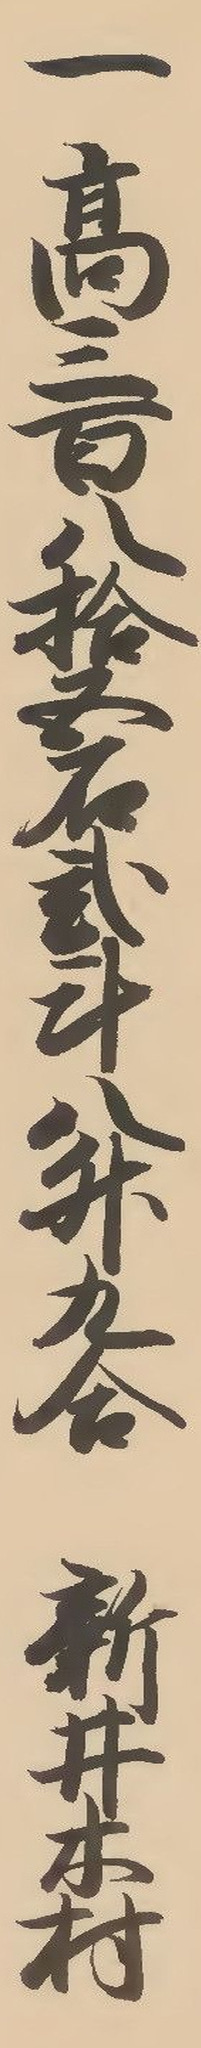一高三百八拾五石弐斗八升九合新井木村
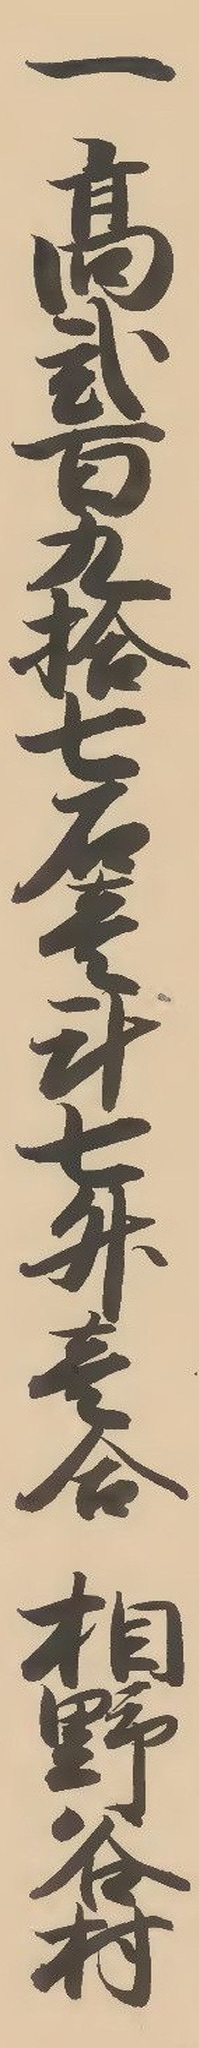一高弐百九拾七石壱斗七升壱合相野谷村
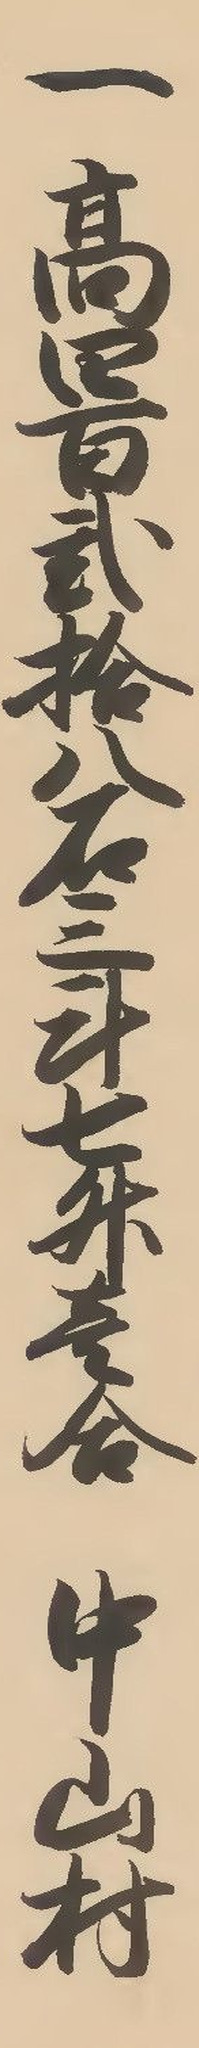一高四百弐拾八石三斗七升壱合中山村
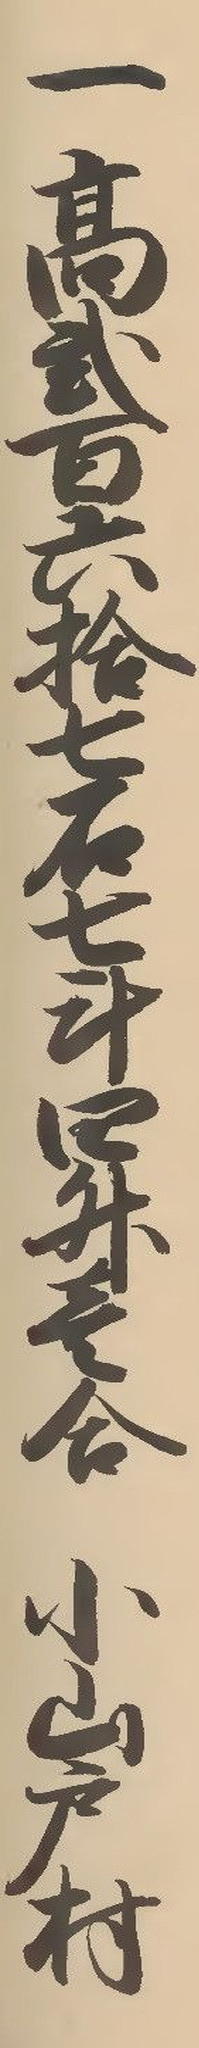一高弐百六拾七石七斗四升壱合小山戸村
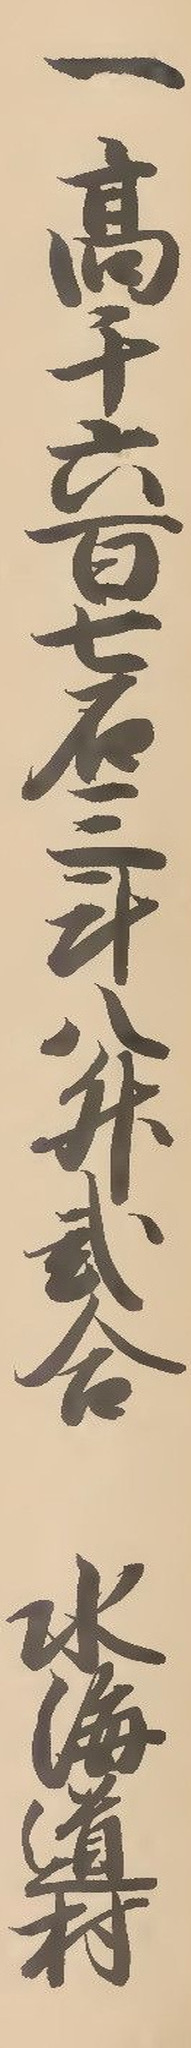一高千六百七石三斗八升弐合水海道村
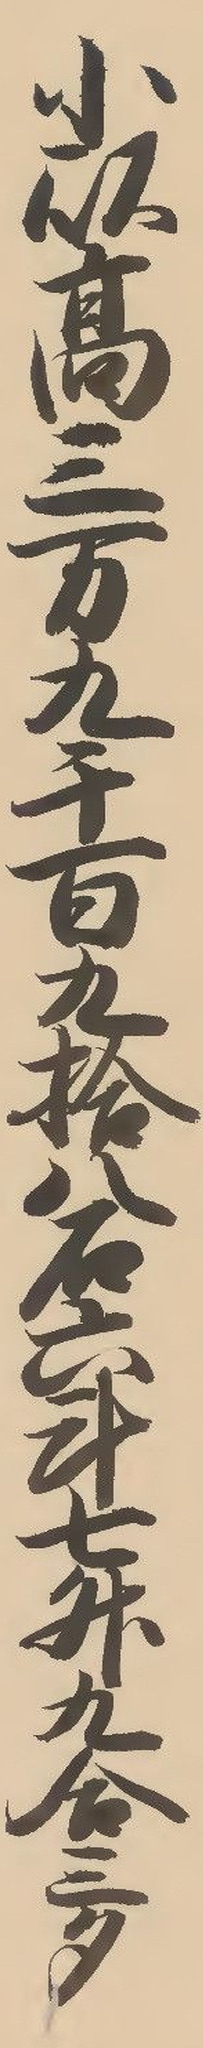小以高三万九千百九拾八石六斗七升九合三勺

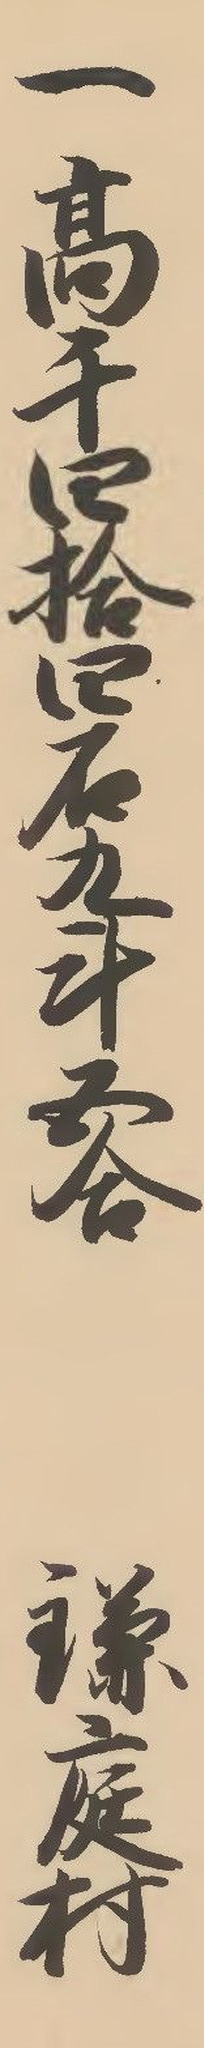一高千四拾四石九斗五合鎌庭村
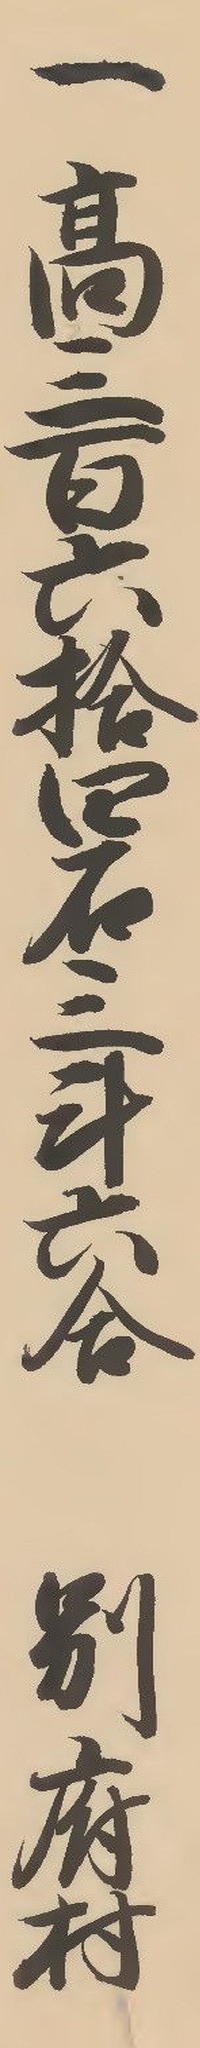一高三百六拾四石三斗六合別府村
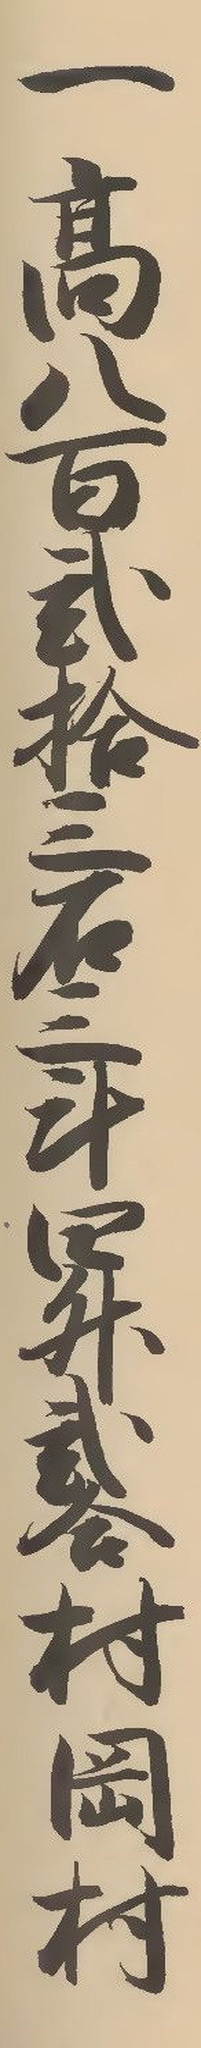一高八百弐拾三石三斗四升弐合村岡村
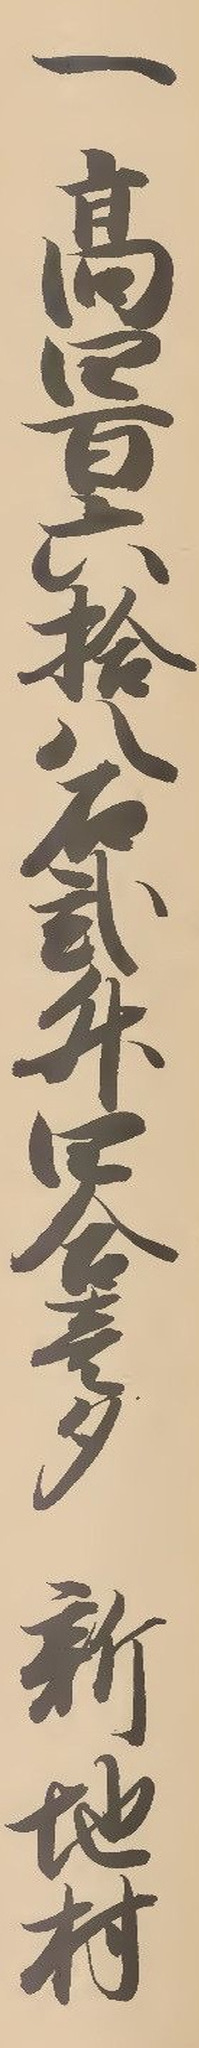一高四百六拾八石弐升四合壱勺新地村
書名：下総国郷帳
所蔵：国立公文書館 National Archives of Japan
